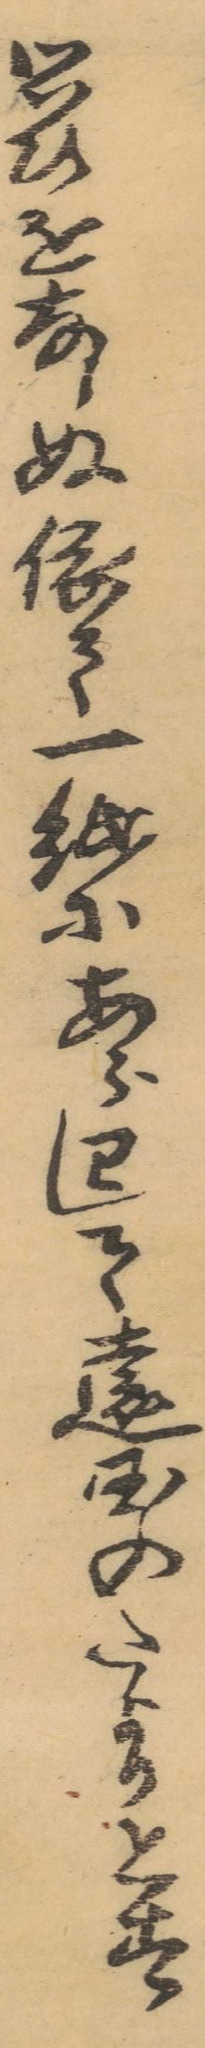思ひを無ぬ依て一紙にあらわして遠国のたよりとす
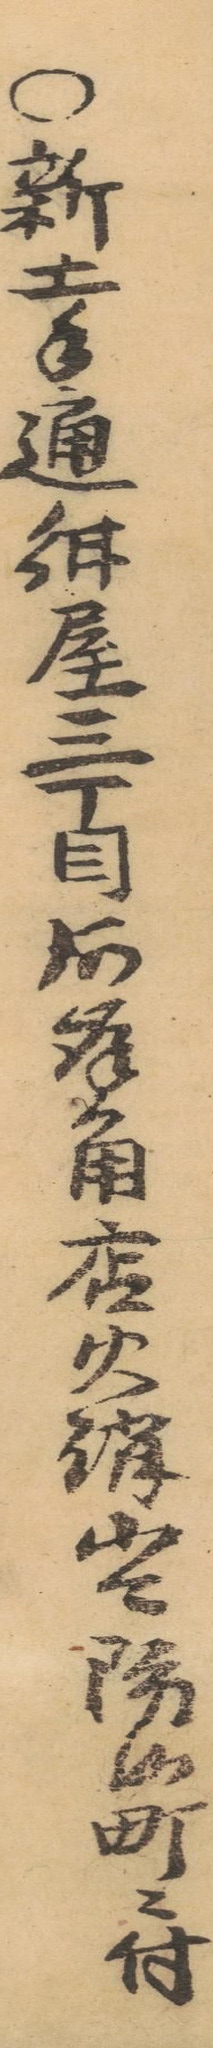〇新土手通紺屋三丁目河岸角店火消少々防候町ニ付
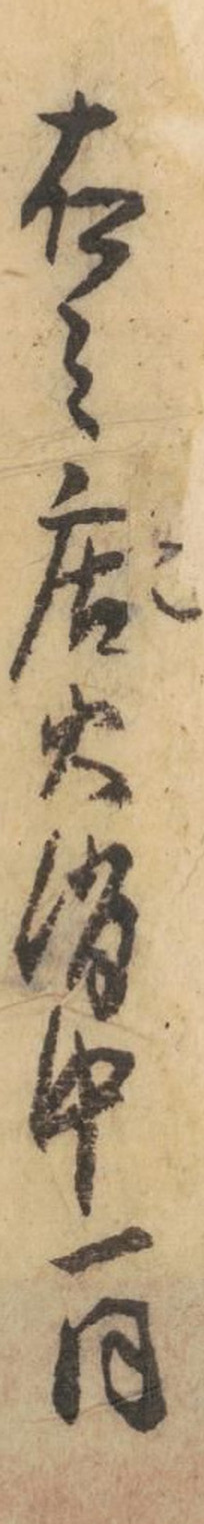右之店火消中一同
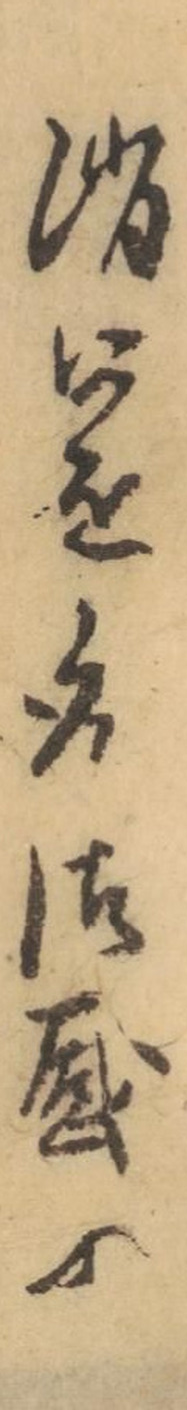消口を取御感に
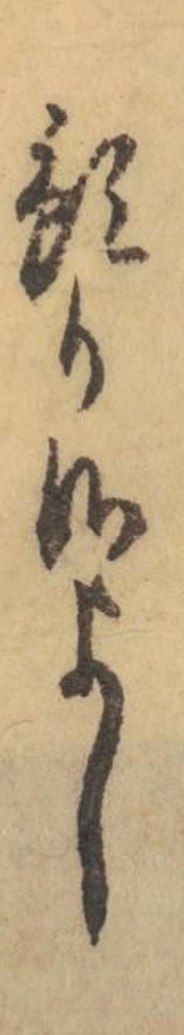預り候よし
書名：[安政元年十二月の江戸大火に関する瓦版]
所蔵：東京大学地震研究所図書室 Earthquake Research Institute Library, The University of Tokyo, JAPAN
